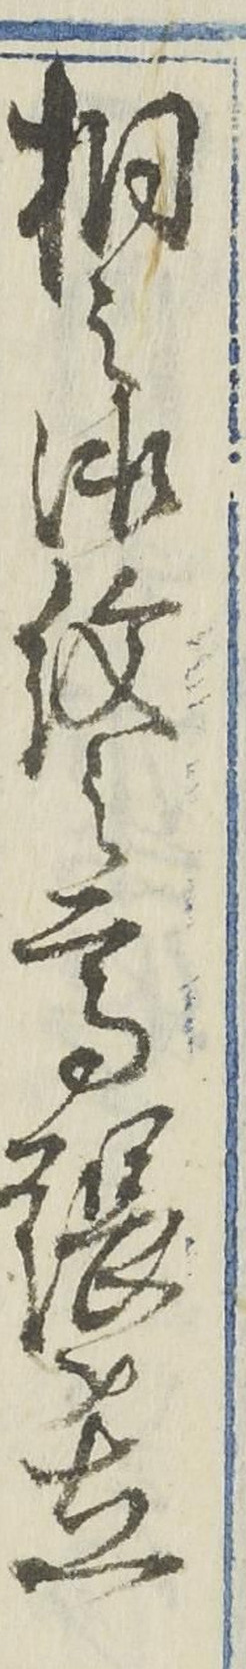桐之御紋之高張ヲ立
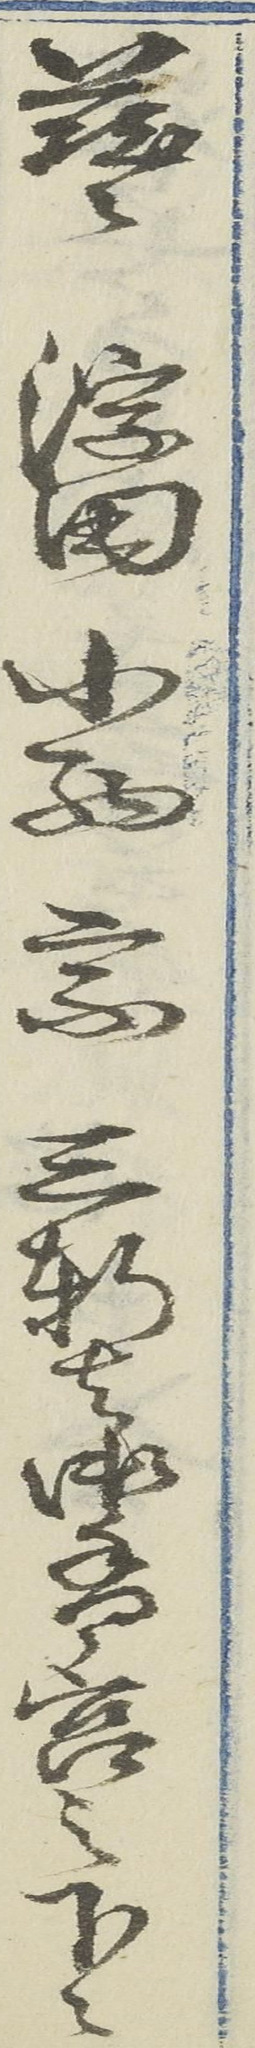茲ニ浮田小西宗三軒は御香ノ宮之下ニ
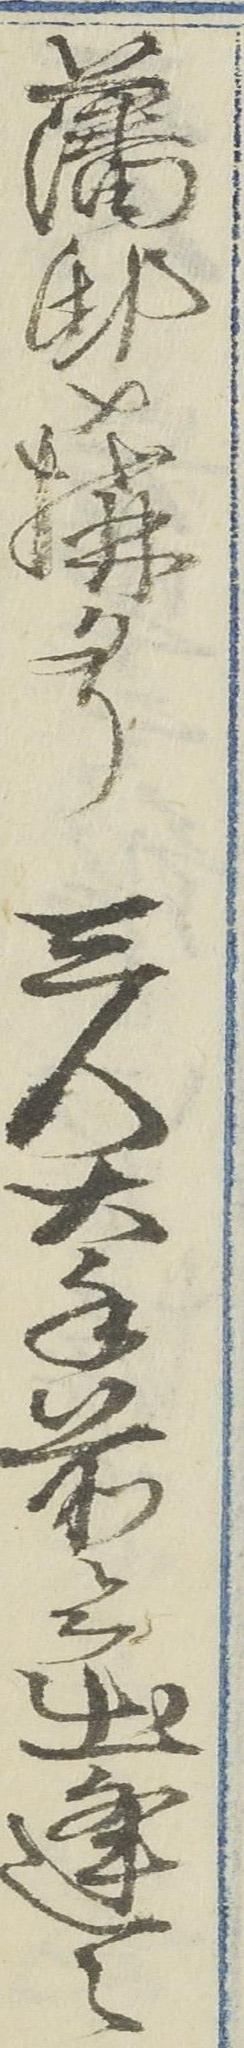藩邸ヲ構タリ三人大手前ニテ出逢之

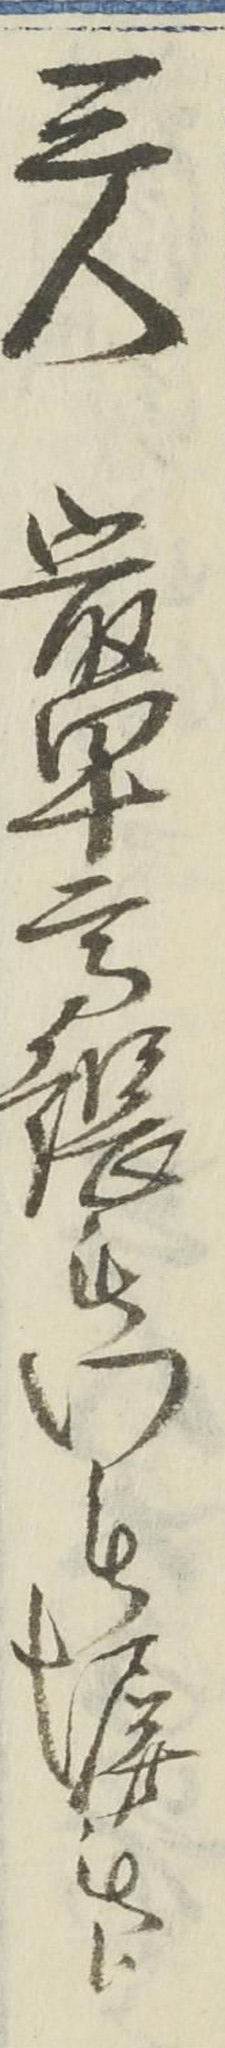三人最早高張も門も塀もト
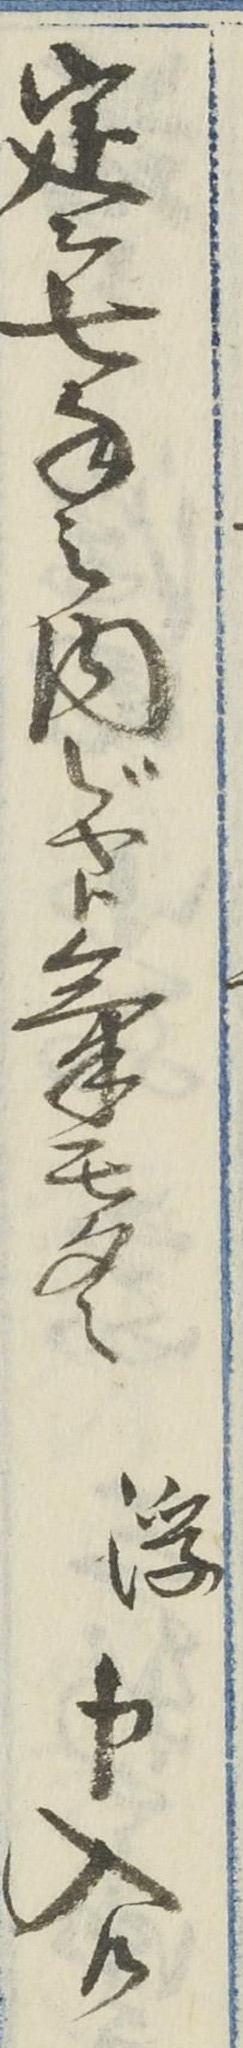定テ七手之内じゃト気モタシ浮申入ル
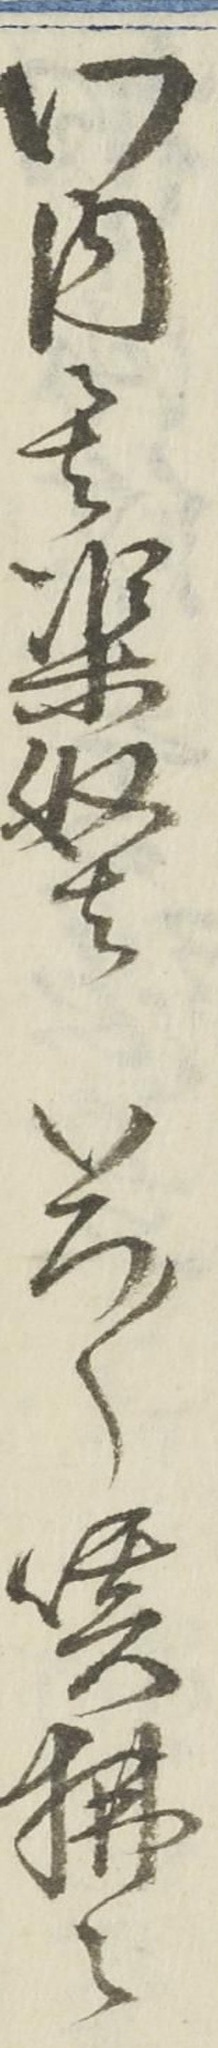門内ニは渠奴はいろ〳〵賃払ニ
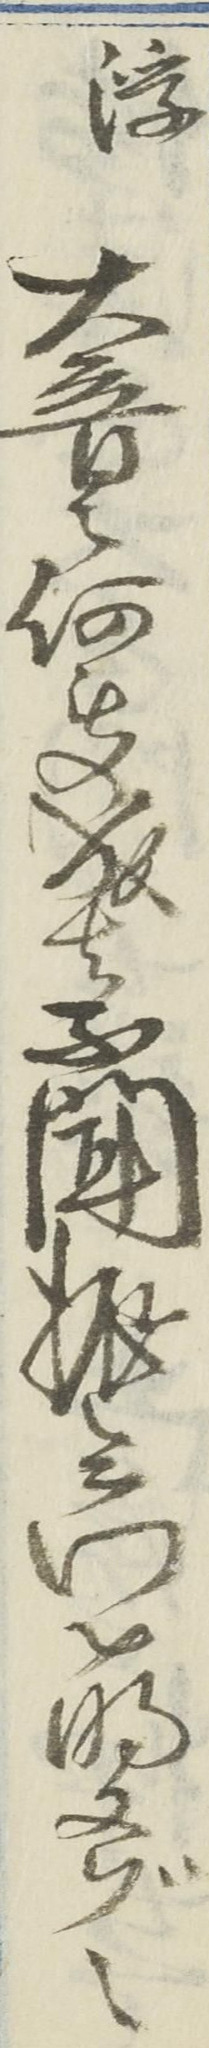浮大音に何もの成は不聞振ニ門ヲ明又ゾニ
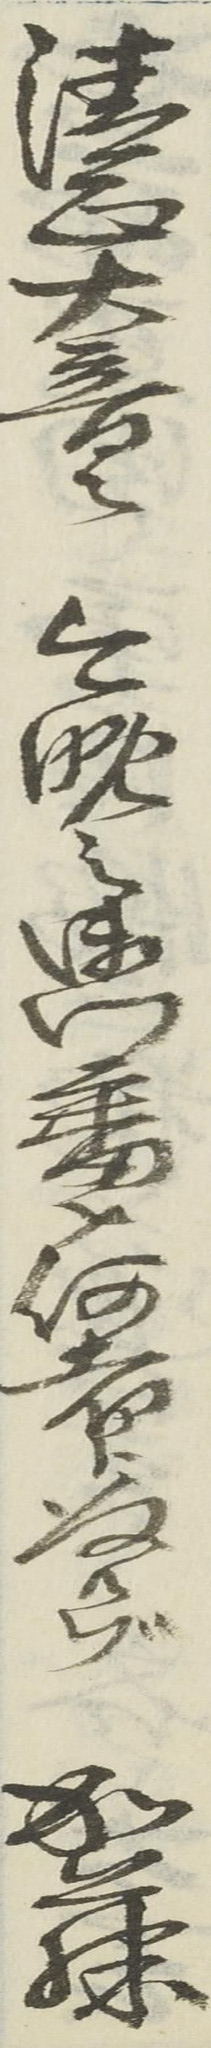清正大音ニ今晩之御門番ヲ何者ト存ルゾ加藤
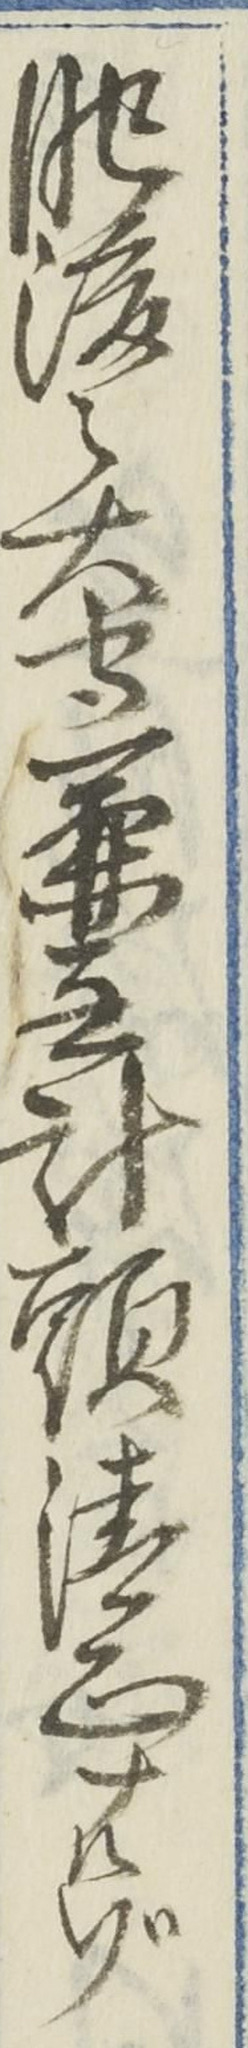肥後之太守兼主頭計清正ナルゾ
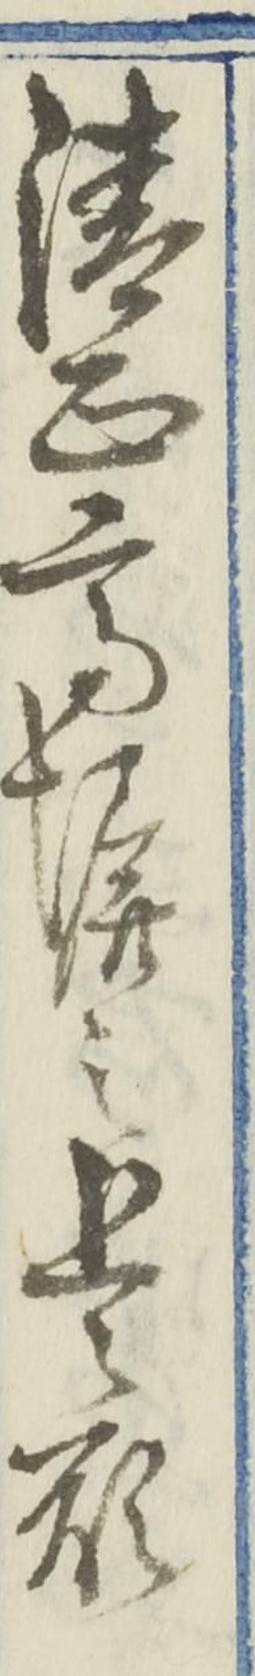清正高塀之上ニ顕
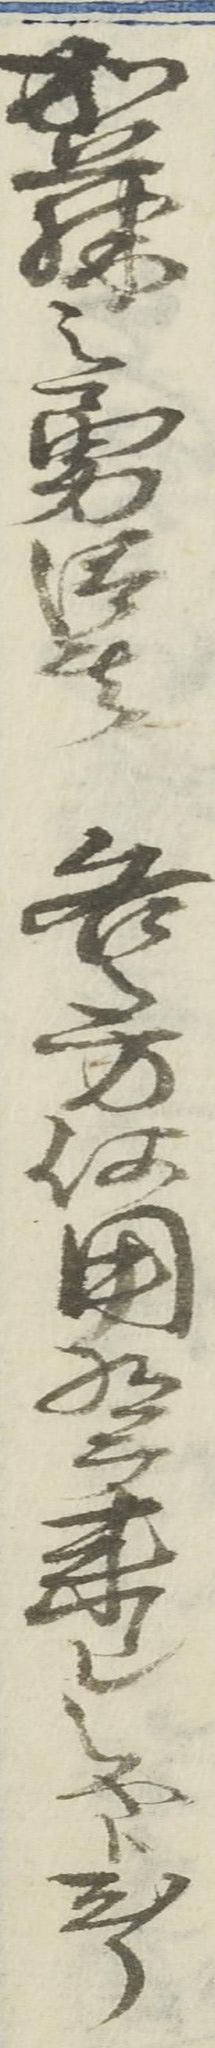加藤之勇臣共各々方何用有テ来レしゃト云フ
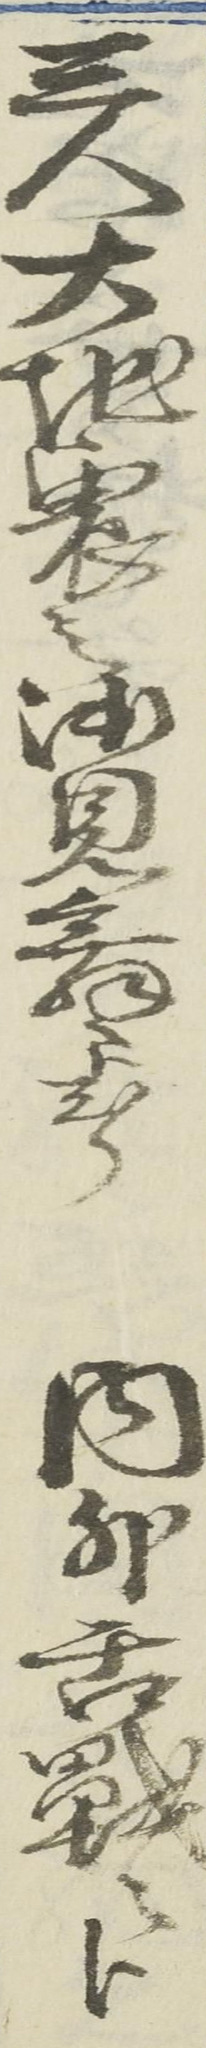三人大地震之御見舞ニト云フ内外舌戦ニト
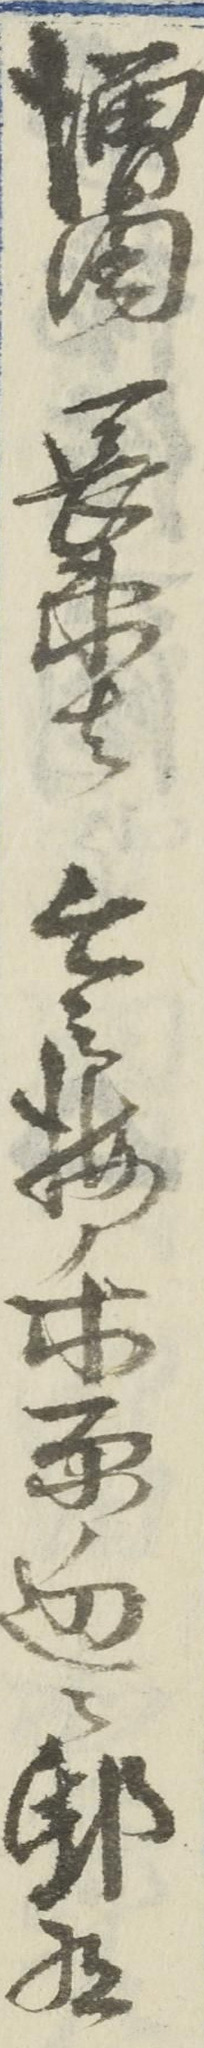増田長束は今之梅ノ木原ノ辺ニ邸有
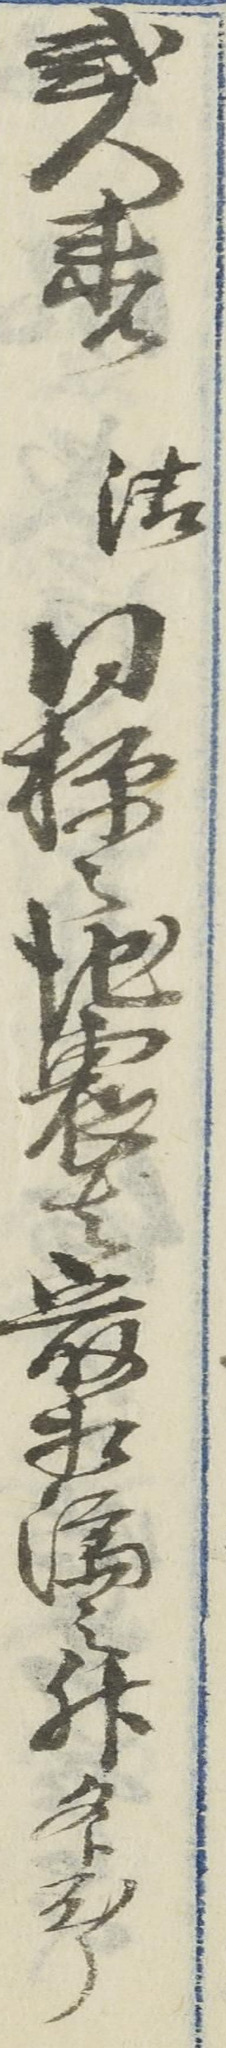弐人来ル清同様ニ地震は最相済之外タト云フ
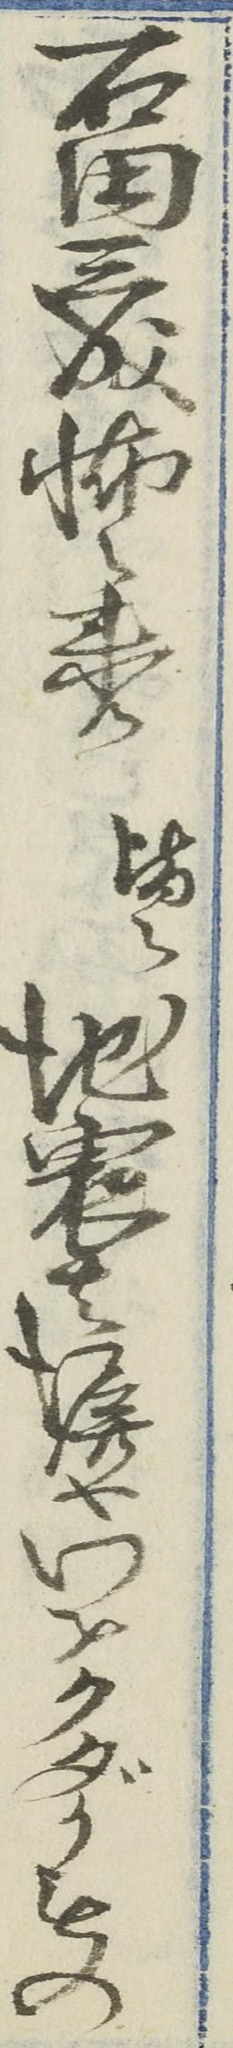石田三成怖〻来ル皆〻地震は塀や門ヲクダクもの
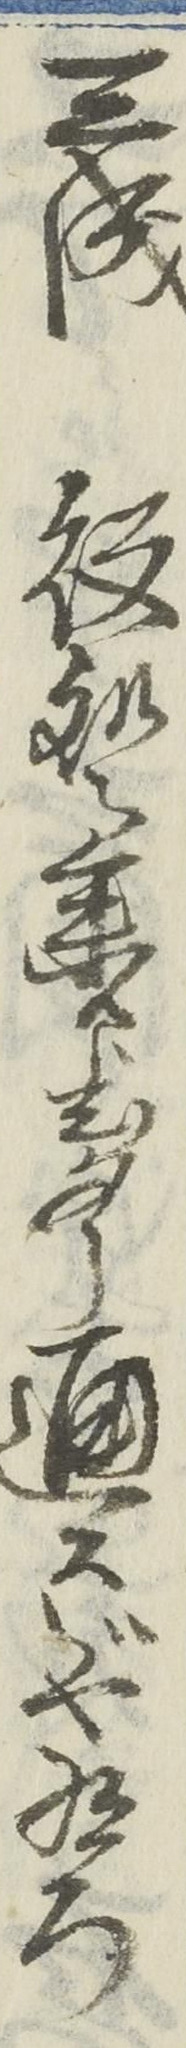三成役処ニ参ルト云タリ通スじゃ有ろ
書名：伏水大地震
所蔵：東京大学地震研究所図書室 Earthquake Research Institute Library, The University of Tokyo, JAPAN
